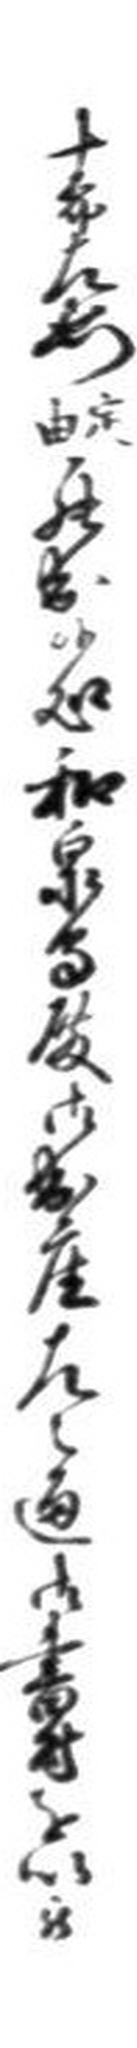十郎左衛門定由罷出候処和泉守殿御出座左之通御書付を以被
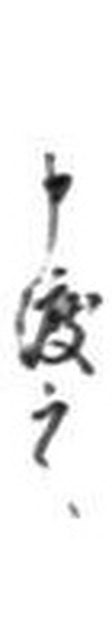申渡之
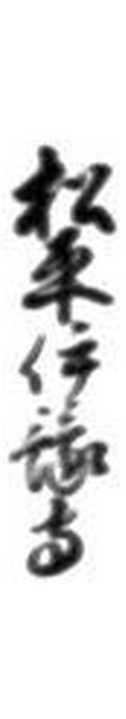松平伊予守
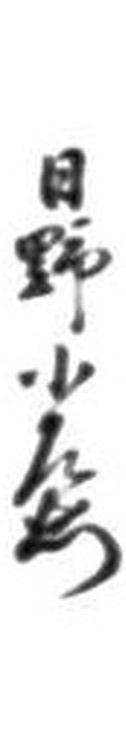日野小左衛門
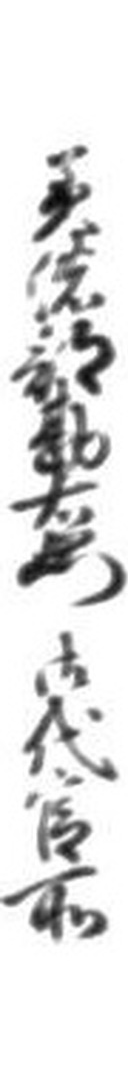美濃部勘右エ門御代官所
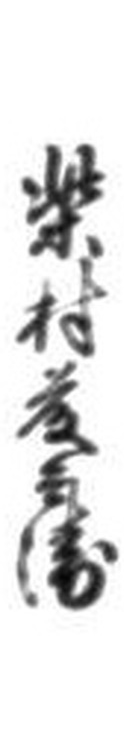柴村藤兵衛
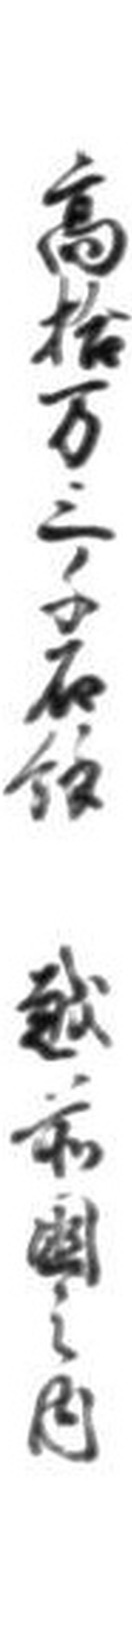高拾万三千石餘越前国之内
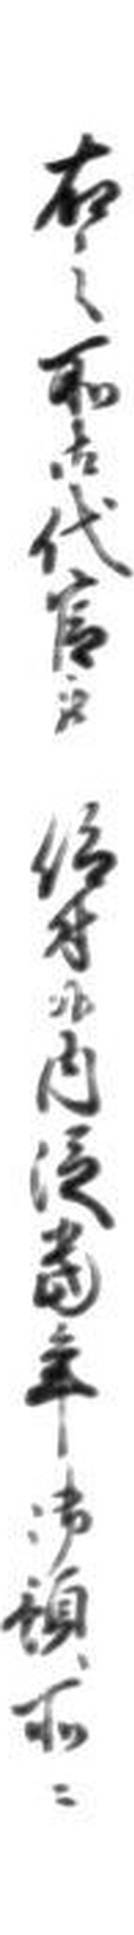右之所御代官被仰付候内従当年御領所ニ
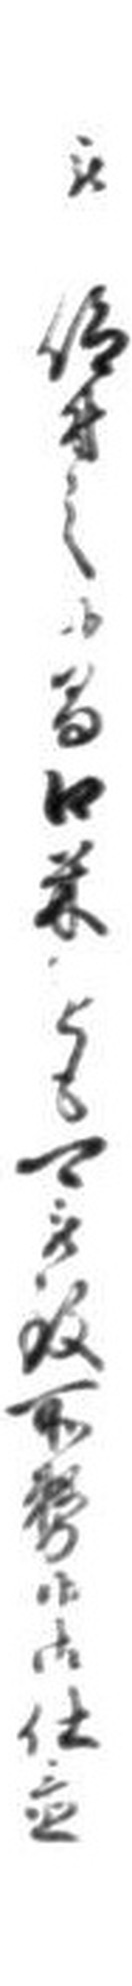被仰付之候間口米をも可被到所努候御仕置
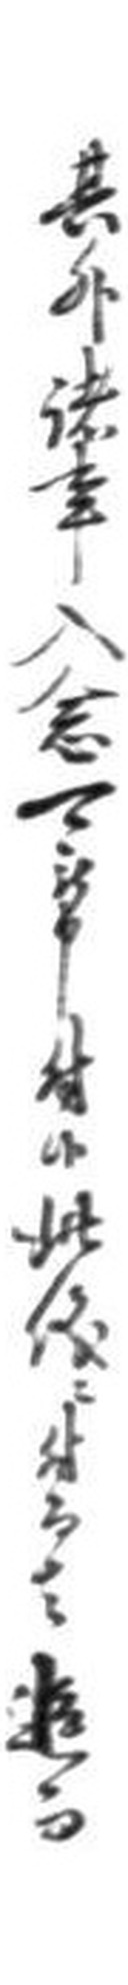其外諸事入念可被申付候此儀ニ付而者追而

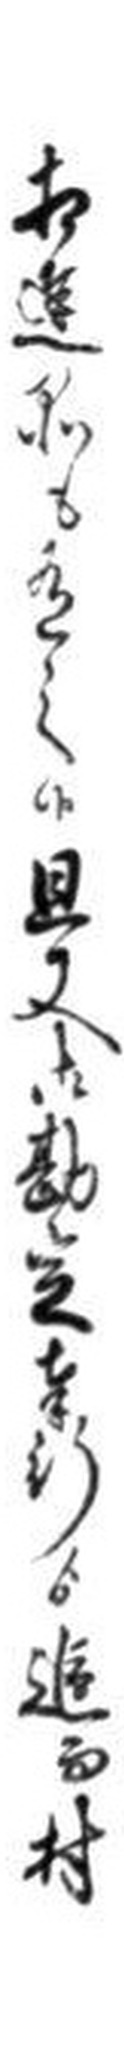相達品も有之候且又御勘定奉行ゟ追而村
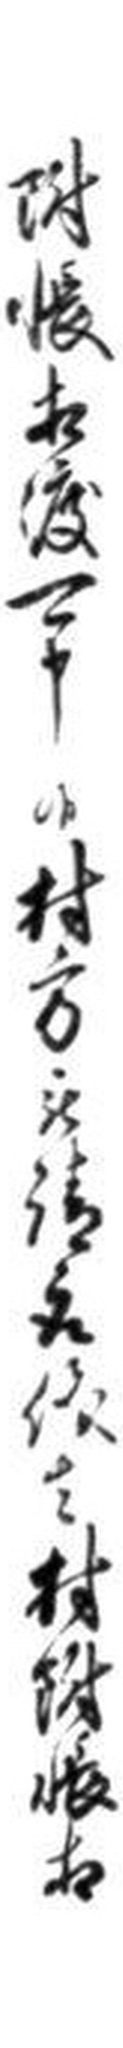附帳相渡可申候村方被請取儀者村附帳相
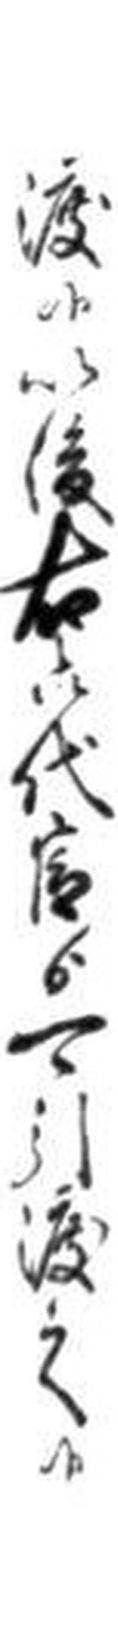渡候以後右御代官ゟ可引渡之候
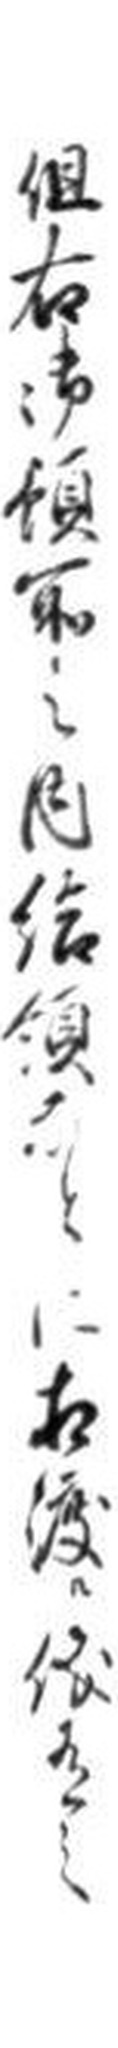但右御預所之内給領などに相渡候儀有之
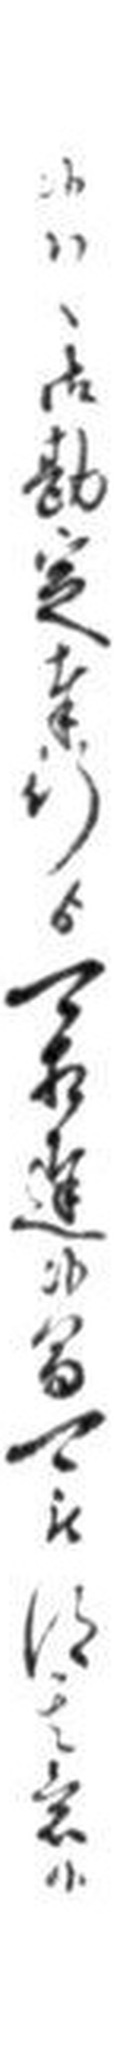候ハヽ御勘定奉行ゟ可相達候間可被得其意候
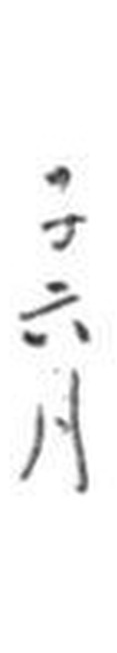子六月
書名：家譜 三十四 吉邦公 従享保五年到同六年
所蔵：福井県文書館 Fukui Prefectural Archives
